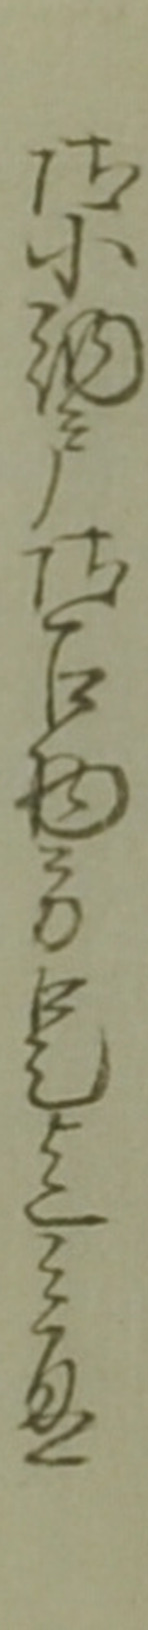御小納戸御召物方是迄之通

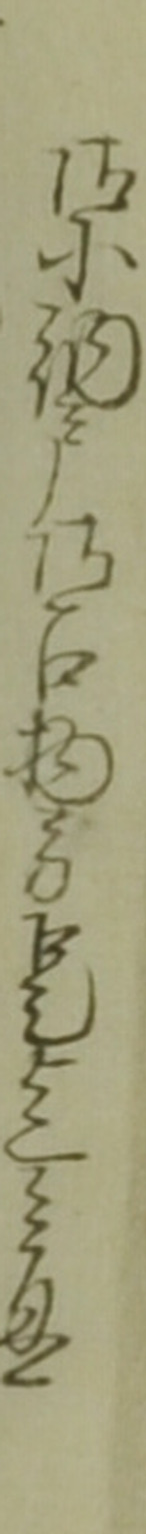御小納戸御召物方是迄之通
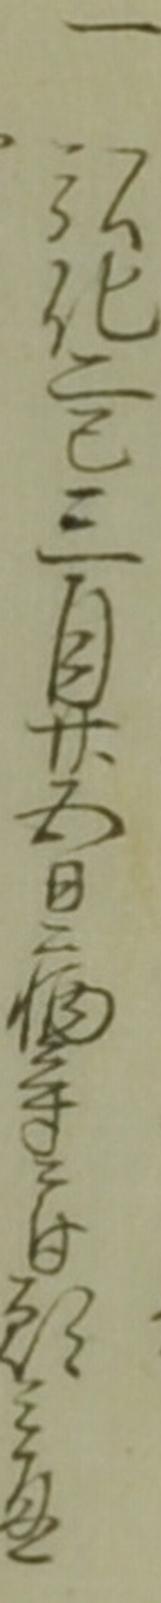一弘化二巳三月廿五日病気ニ付願之通
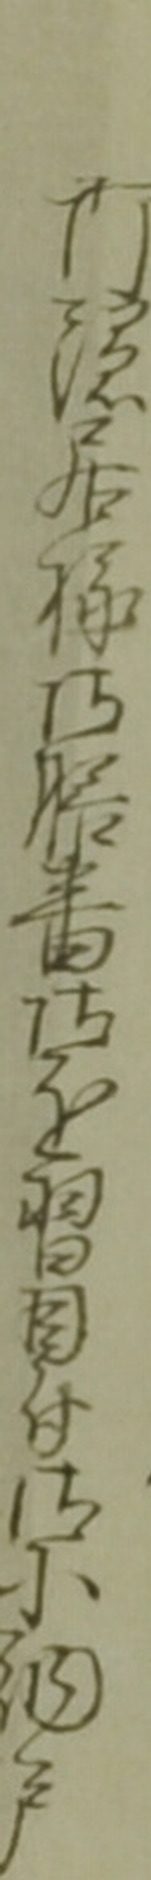御隠居様御膳番御近習目付御小納戸
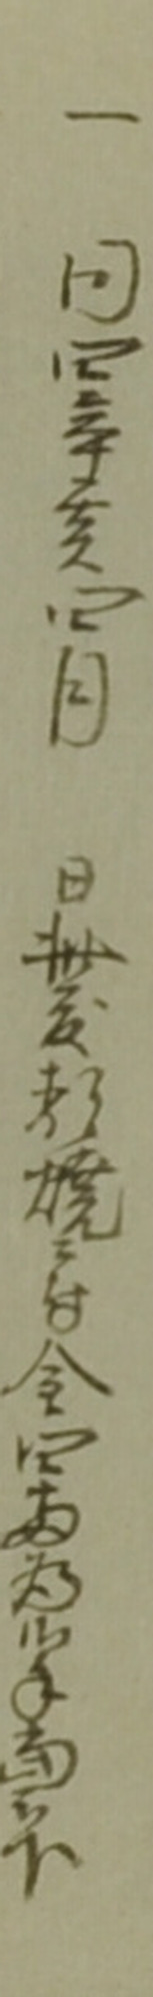一同四辛亥四月日此度類焼ニ付金四両為御手当被下
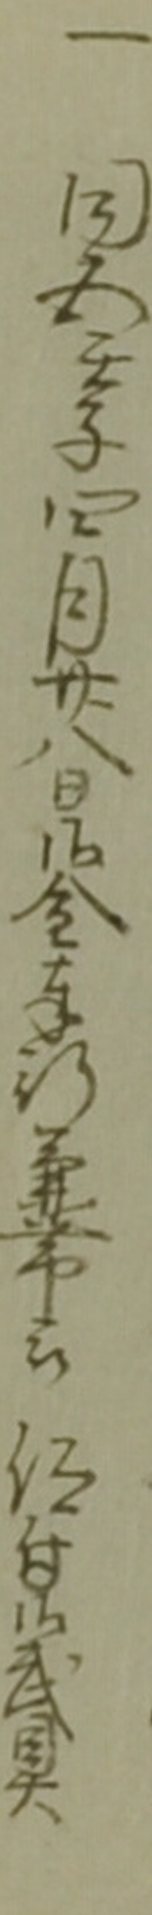一同五壬子四月廿八日御金奉行兼帯被仰付御武具
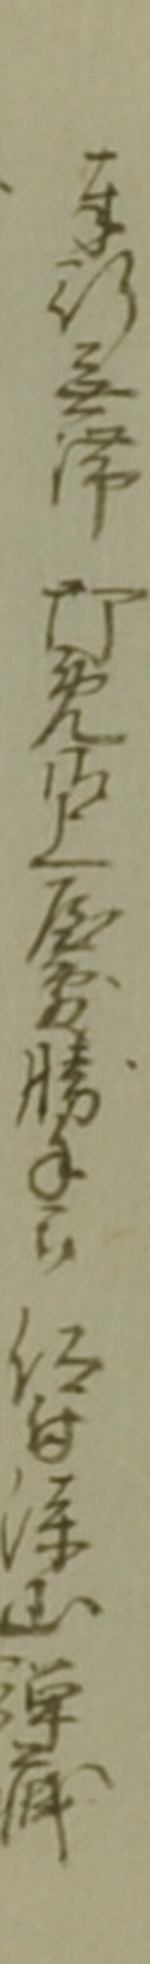奉行無滞御免御上屋敷勝手被仰付保山禅蔵
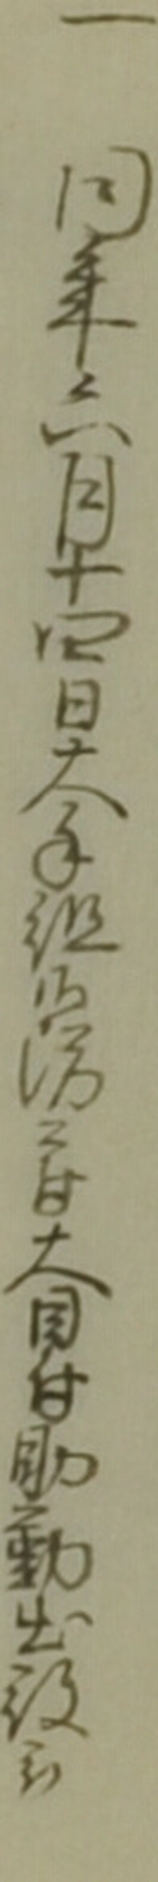一同年六月十四日大手組御防ニ付大目付助勤出役被
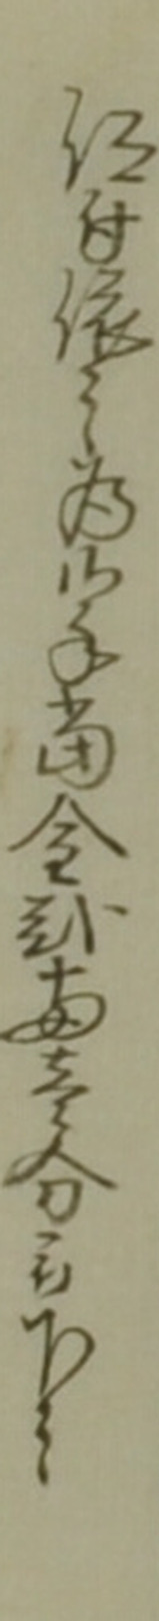仰付依之為御手当金弐両壱分被下之
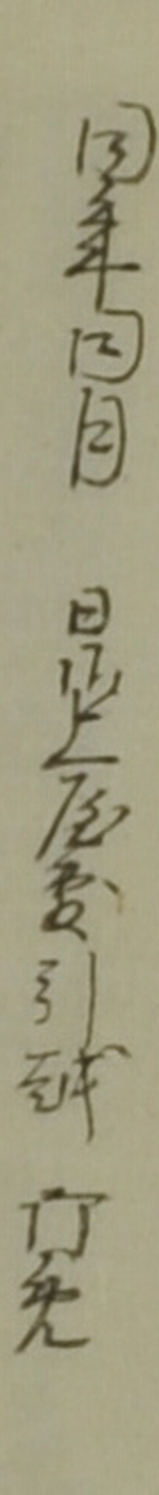一同年四月日御上屋敷引越御免
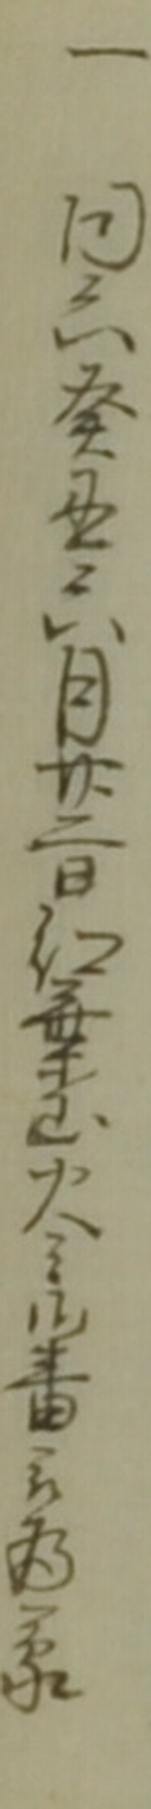一同六癸丑六月廿二日紅葉山火之御番被為蒙
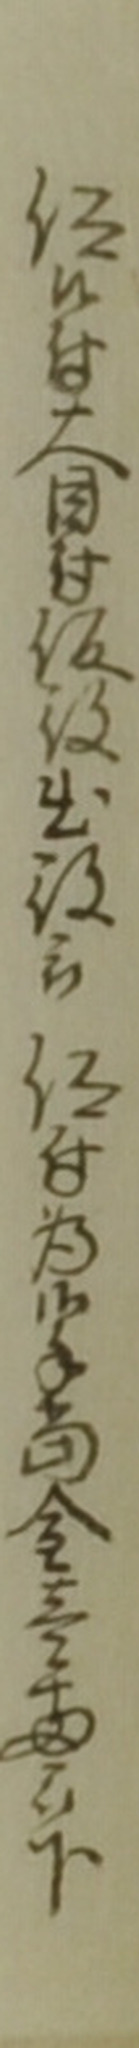仰候付大目付仮役出役被仰付為御手当金壱両被下
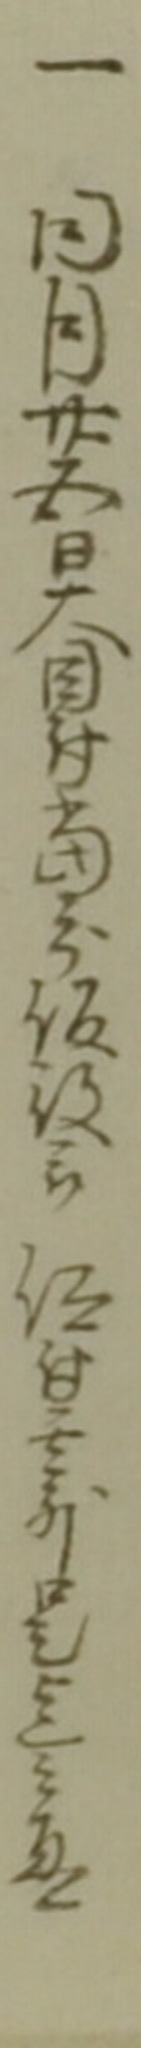一同月廿五日大目付当分仮役被仰付其外是迄之通
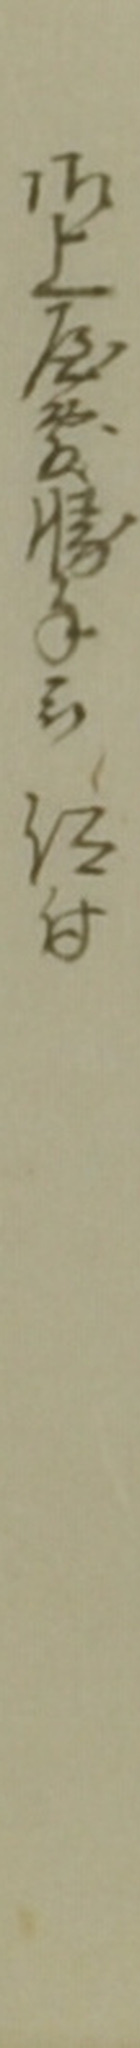御上屋敷勝手被仰付
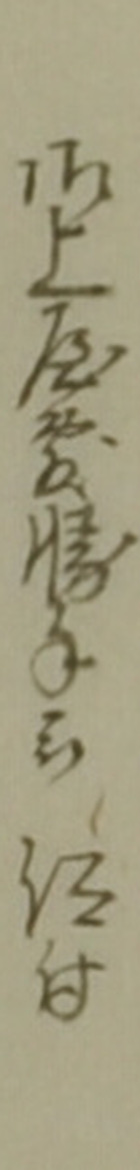御上屋敷勝手被仰付
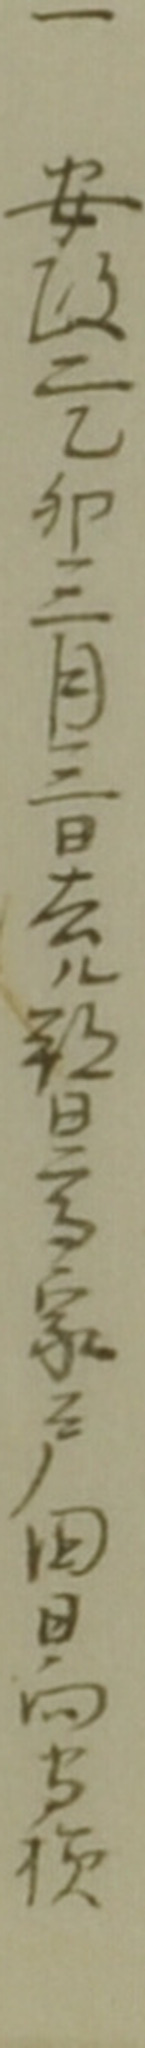一安政二乙卯三月三日去ル朔日高家戸田日向守様
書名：給人諸士勤仕録（三）
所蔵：伊那市立高遠町図書館・合同会社AMANE
